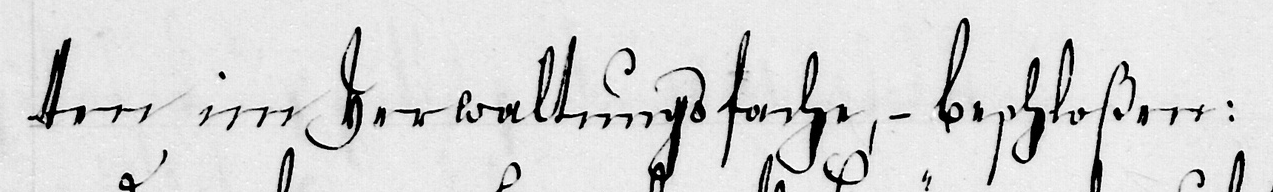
ten im Verwaltungsfache, – beschloßen:
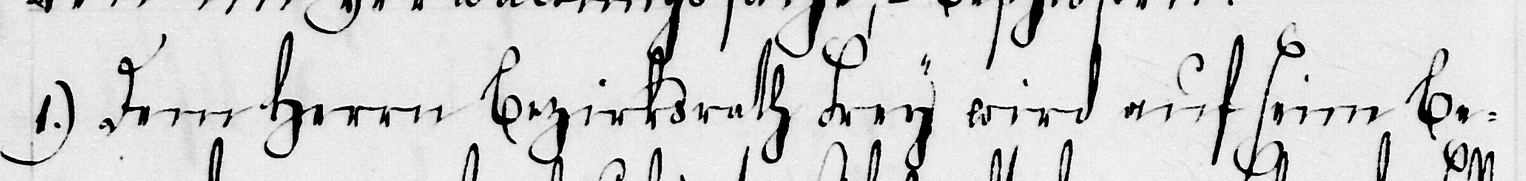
1.) Dem Herrn Berzirksrath Frey wird auf seine Be¬
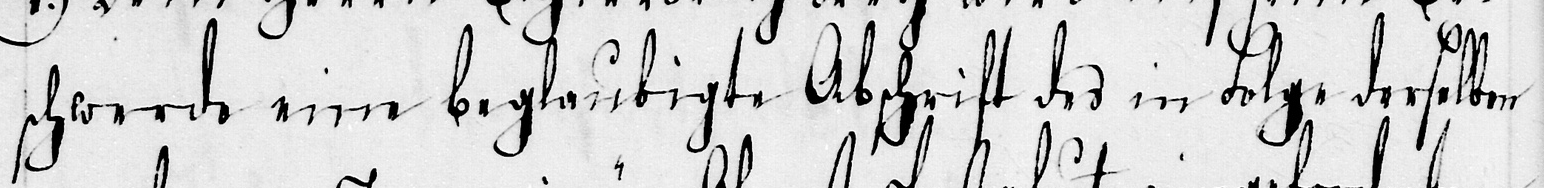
schwerde eine beglaubigte Abschrift des in Folge derselben
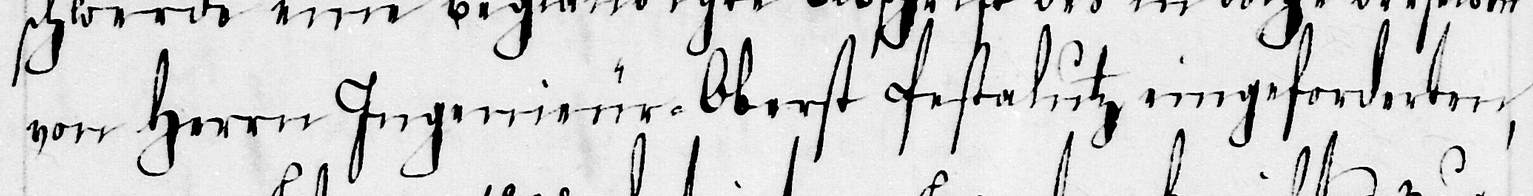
von Herrn Ingenieur-Oberst Pestalutz eingeforderten,
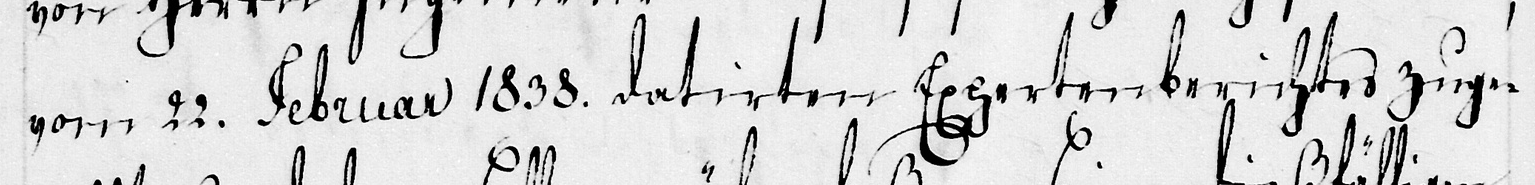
vom 22. Februar 1838. datirten Expertenberichtes zuges¬
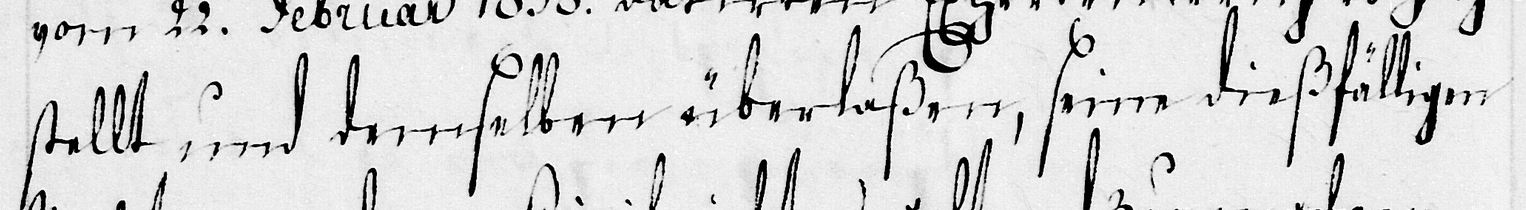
tellt und demselben überlaßen, seine dießfälligen
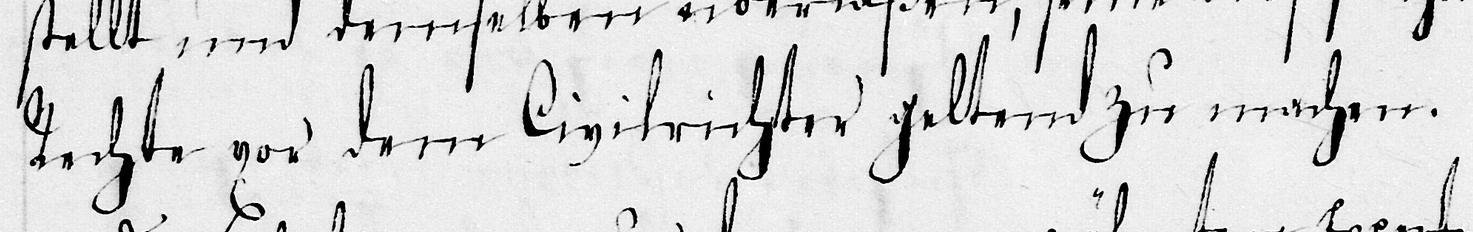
Rechte vor dem Civilrichter geltend zu machen.
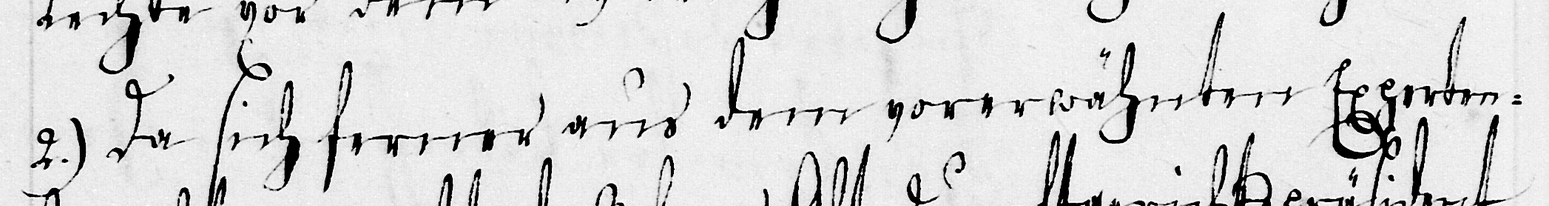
2.) Da sich ferner aus dem vorerwähnten Experten¬
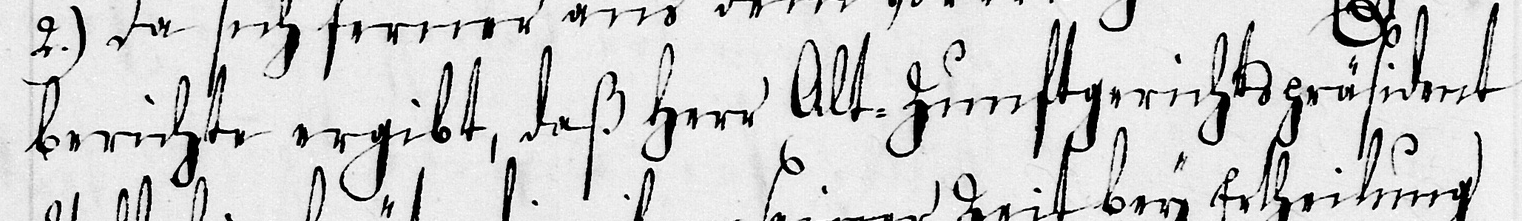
berichte ergibt, daß Herr Alt-Zunftgerichtspräsident
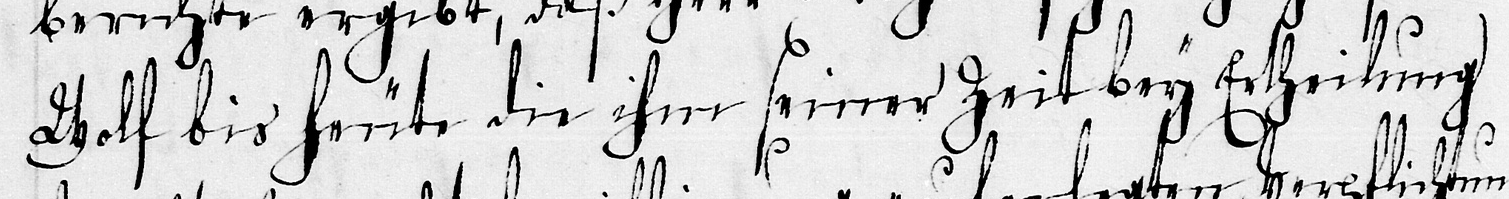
Wolf bis heute die ihm seiner Zeit bey Ertheilung
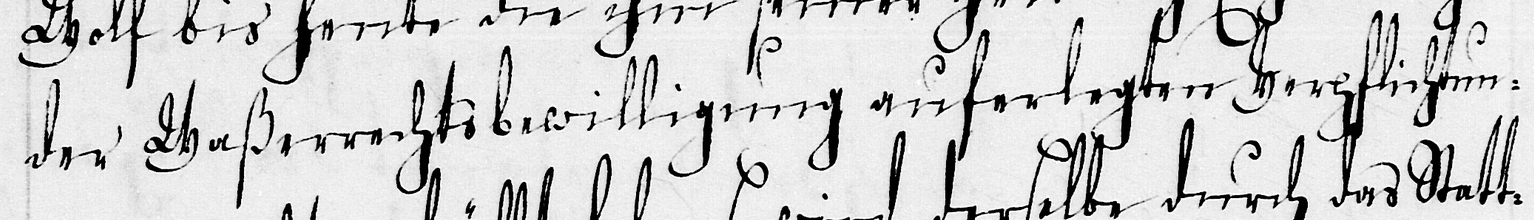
der Waßerrechtsbewilligung auferlegten Verpflichtun¬
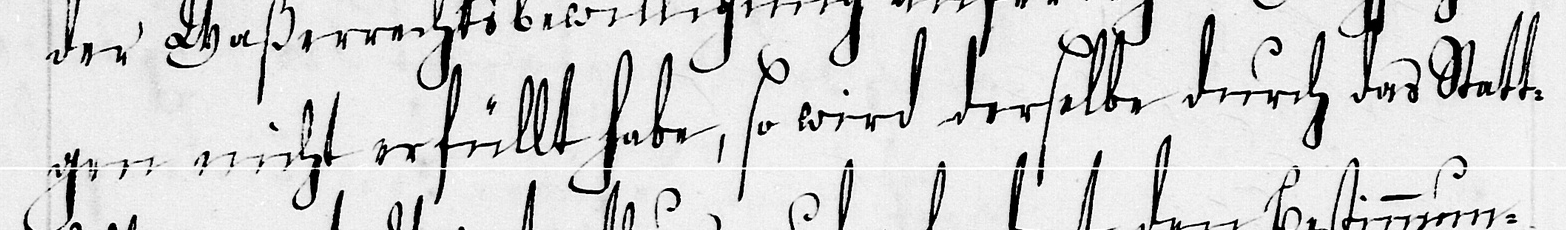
gen nicht erfüllt habe, so wird derselbe durch das Stat¬
